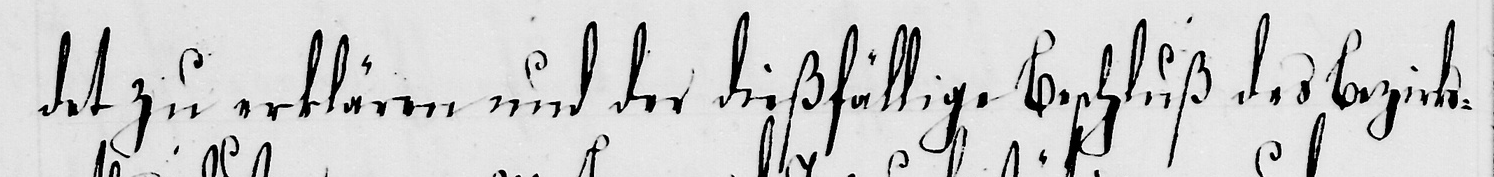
det zu erklären und der dießfällige Beschluß des Bezir¬
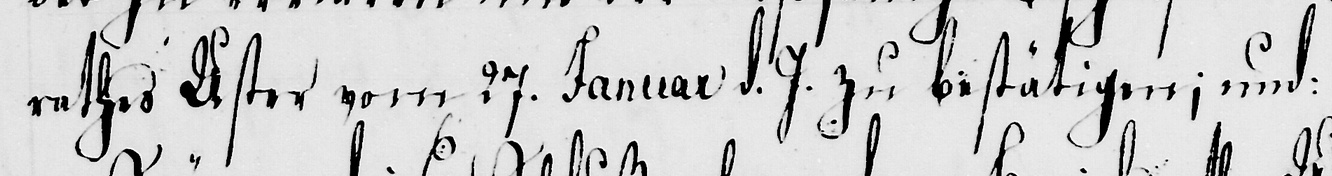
rathes Uster vom 27. Januar d. J. zu bestätigen; und:
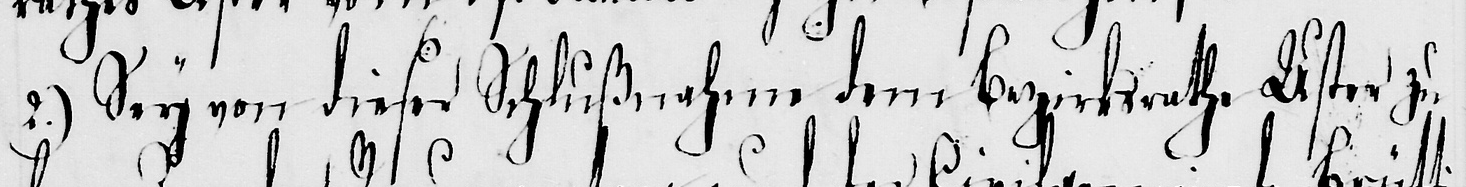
2.) Sey von dieser Schlußnahme dem Bezirksrathe Uster zu
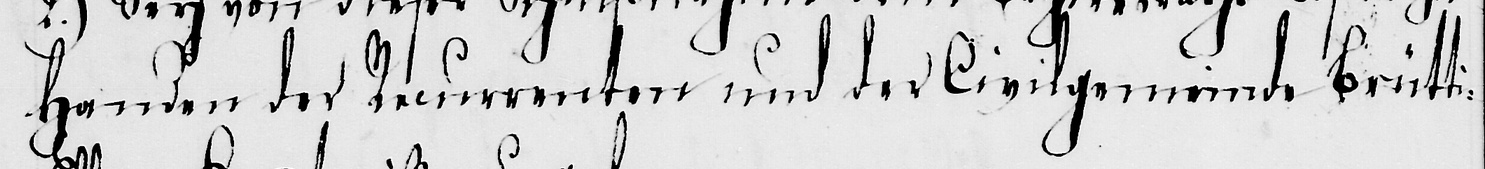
Handen der Recurrenten und der Civilgemeinde Brüt¬
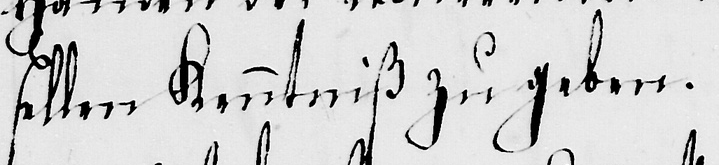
sellen Kenntniß zu gegeben.
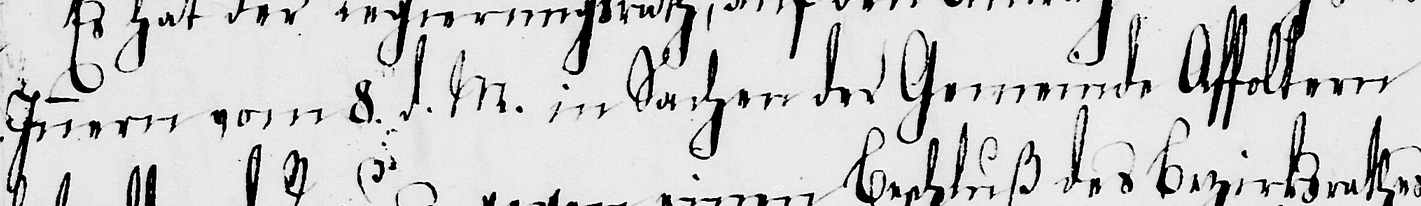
Innern vom 8. d. M. in Sachen der Gemeinde Affoltern
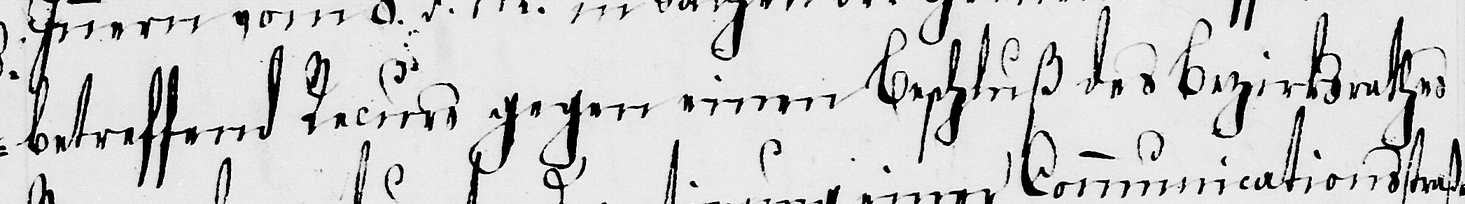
betreffend Recurs gegen einen Beschluß des Bezirksrathes
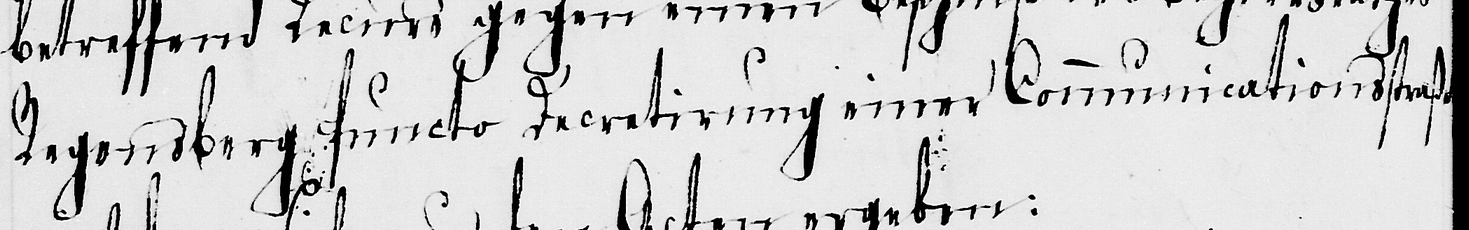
Regensberg Puncto Decretirung einer Communicationsstra¬
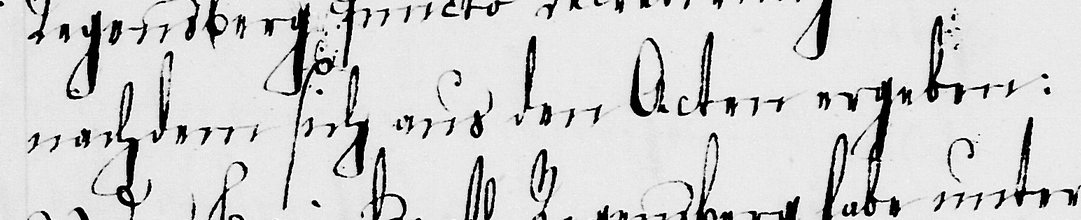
nachdem sich aus den Acten ergeben:
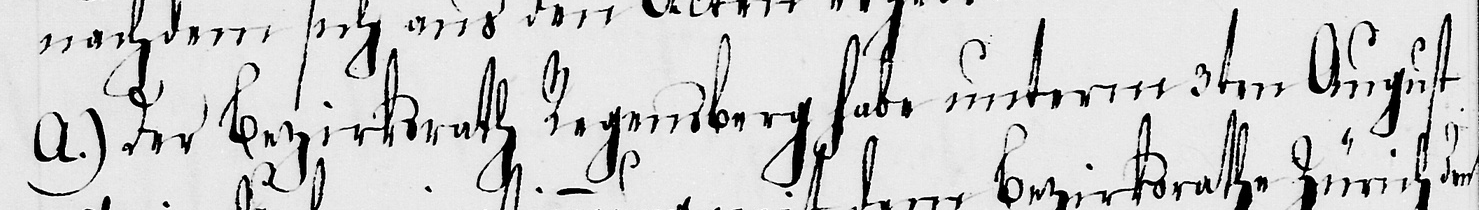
A.) Der Bezirksrath Regensberg habe unterm 3ten August
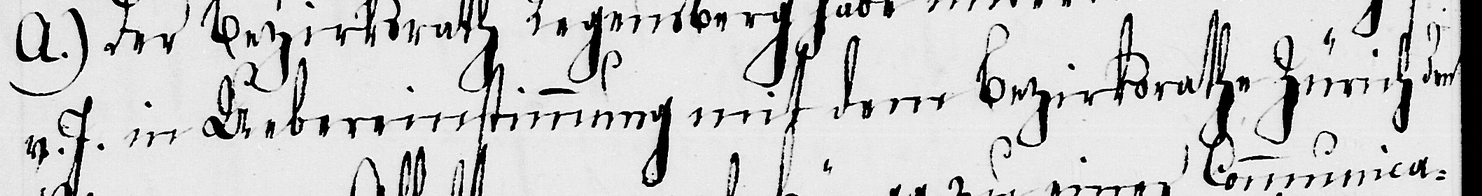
v. J. in Uebereinstimmung mit dem Bezirksrathe Zürich den
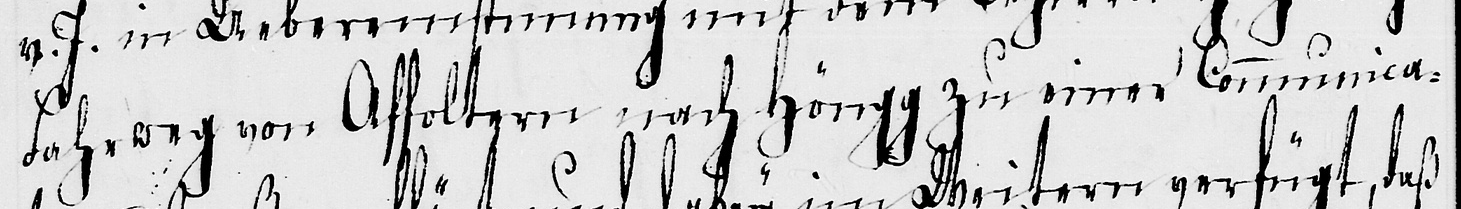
Fahrweg von Affoltern nach Höngg zu einer Communica¬
